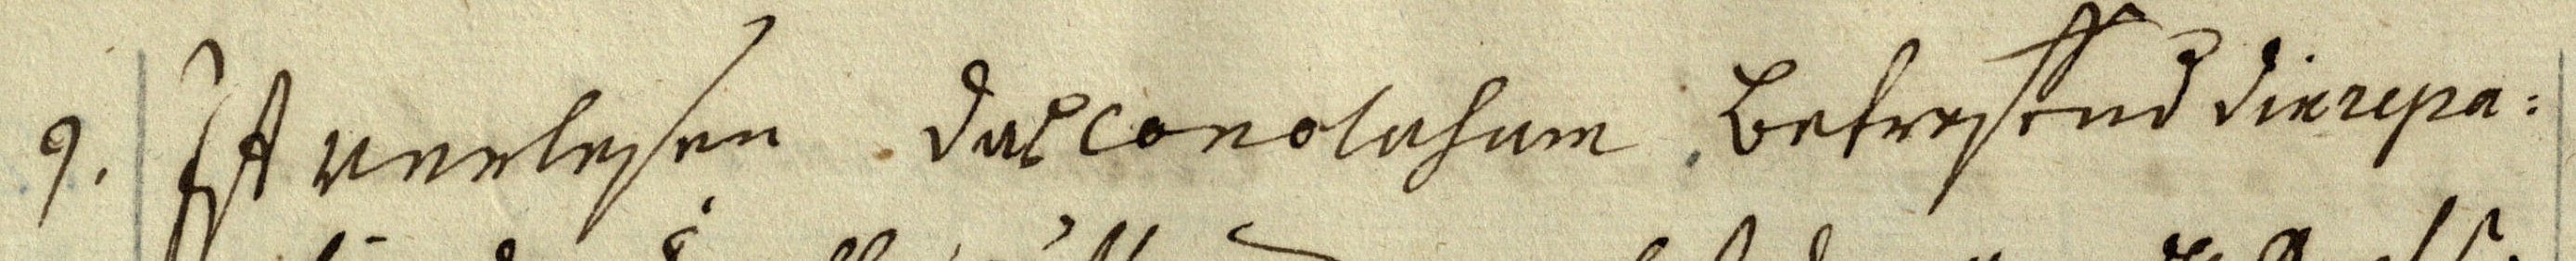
9. Ist verlesen das conclusum betreffend die repa¬
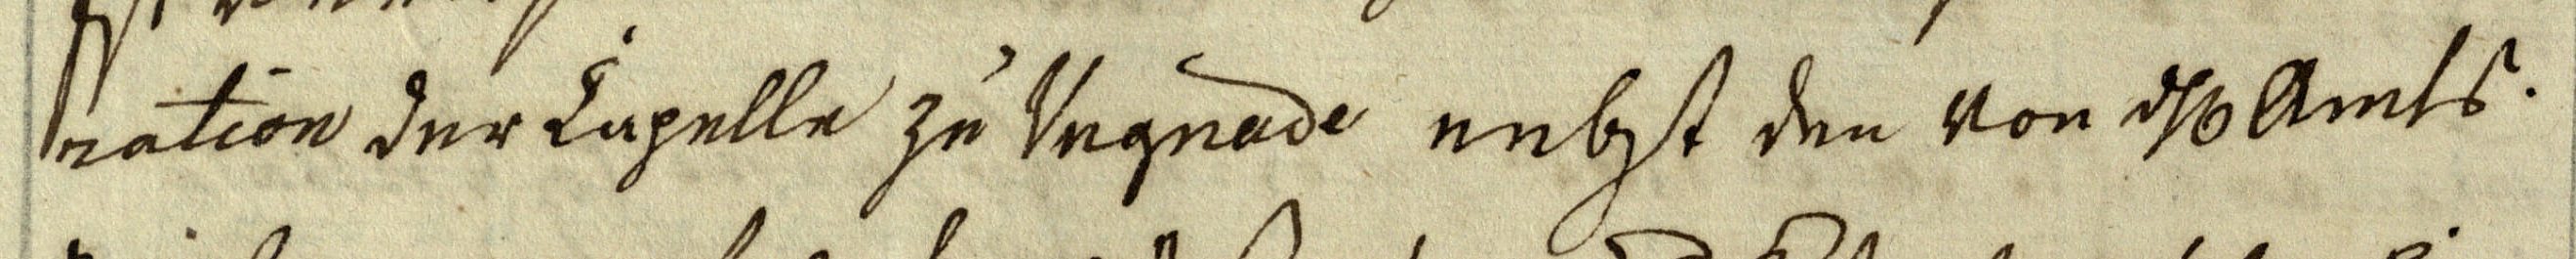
ration der Capelle zu Ungnade nebst den von dh Amts¬
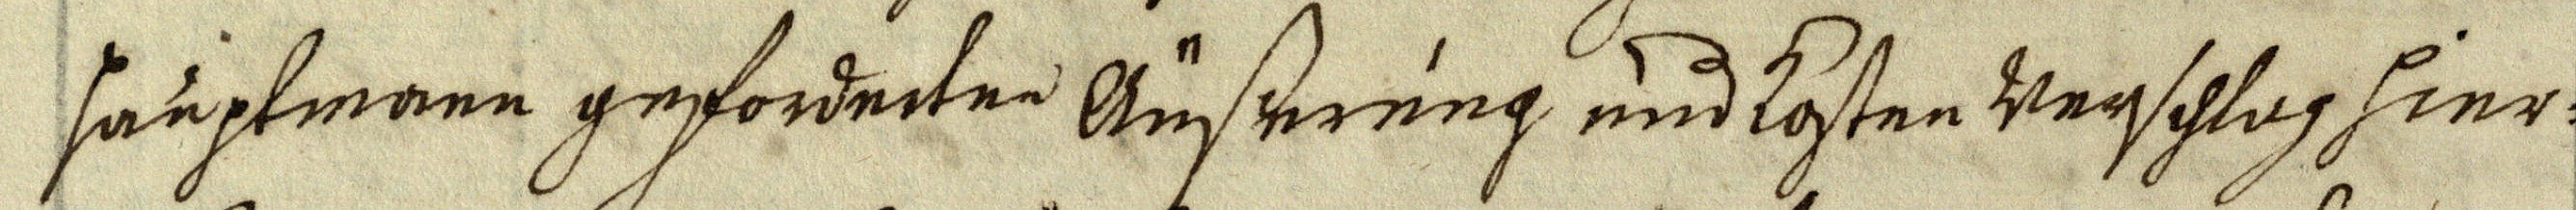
hauptmann geforderten Äußerung und Kosten Vorschlag hier¬
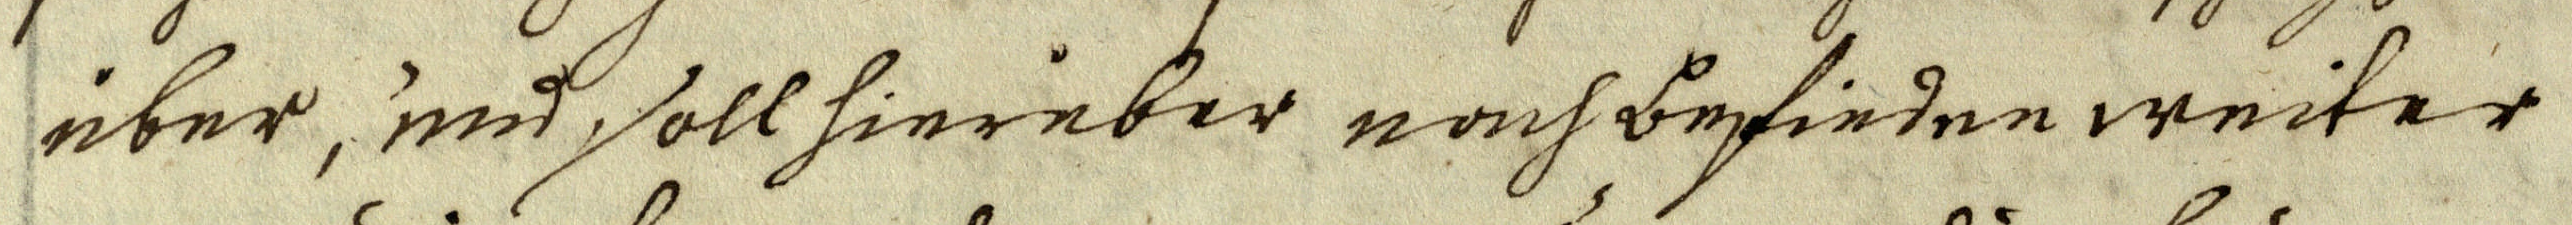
über, und soll hierüber nach Befinden weiter
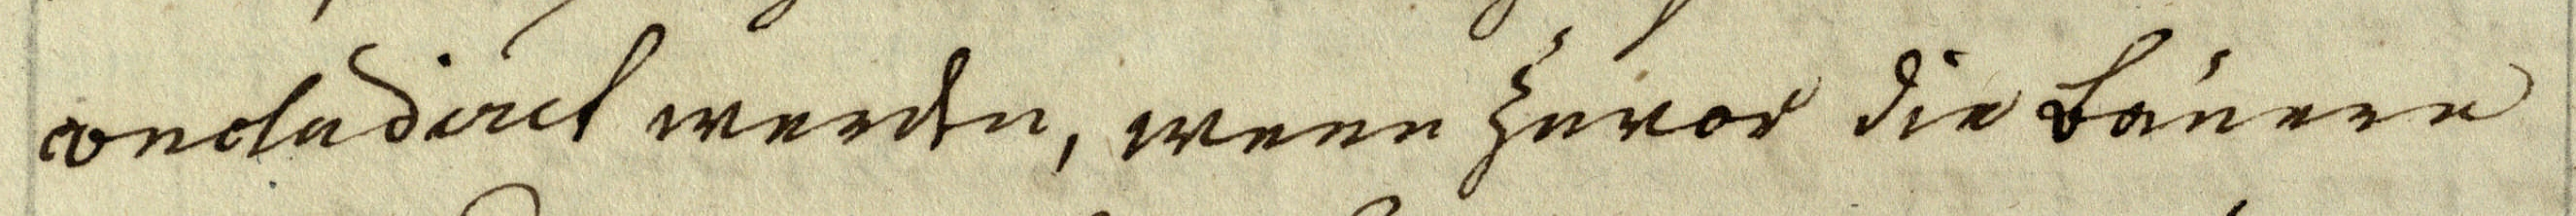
concludiret werden, wenn zuvor die Bauern
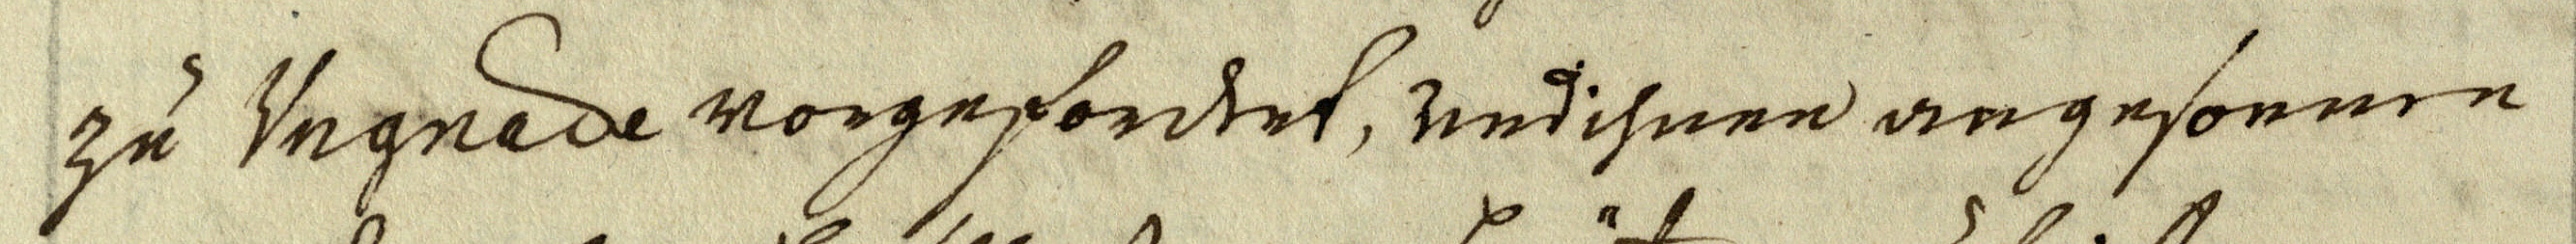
zu Ungnade vorgefordert, und ihnen angesonnen
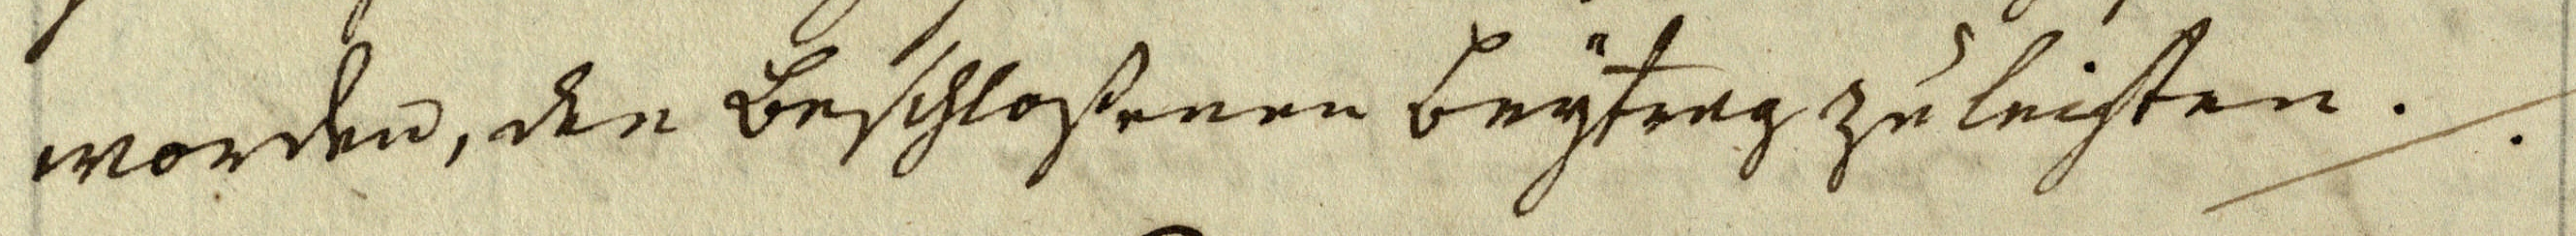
worden, den beschloßenen Beÿtrag zu leisten.
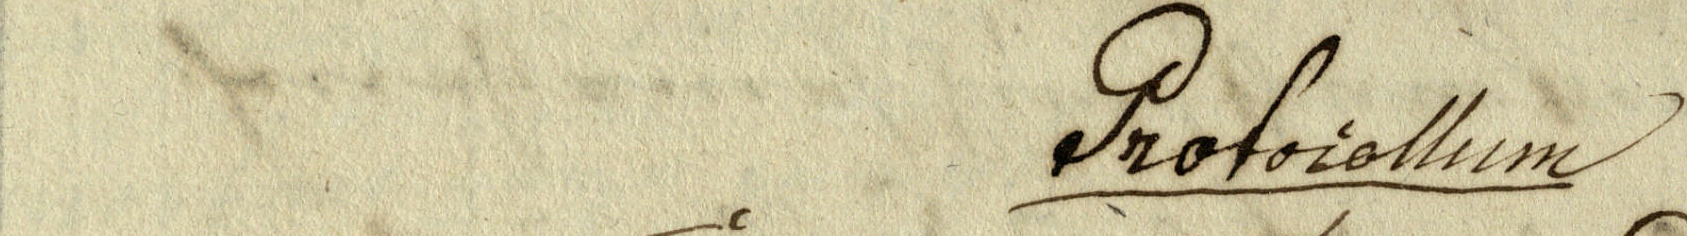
Protocollum
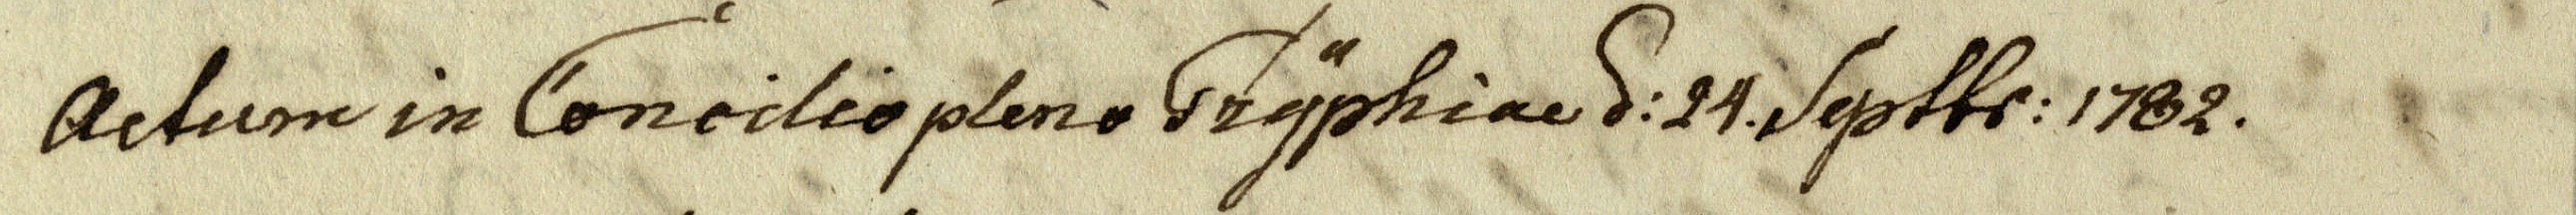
Actum in Concilio pleno Gryphiae d. 24 Septbr. 1782
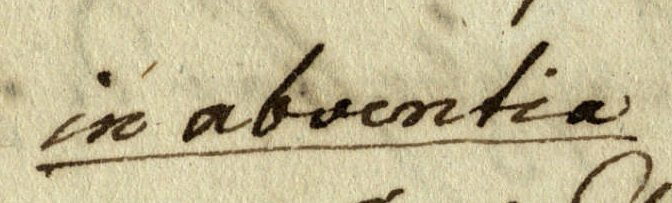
in absentia
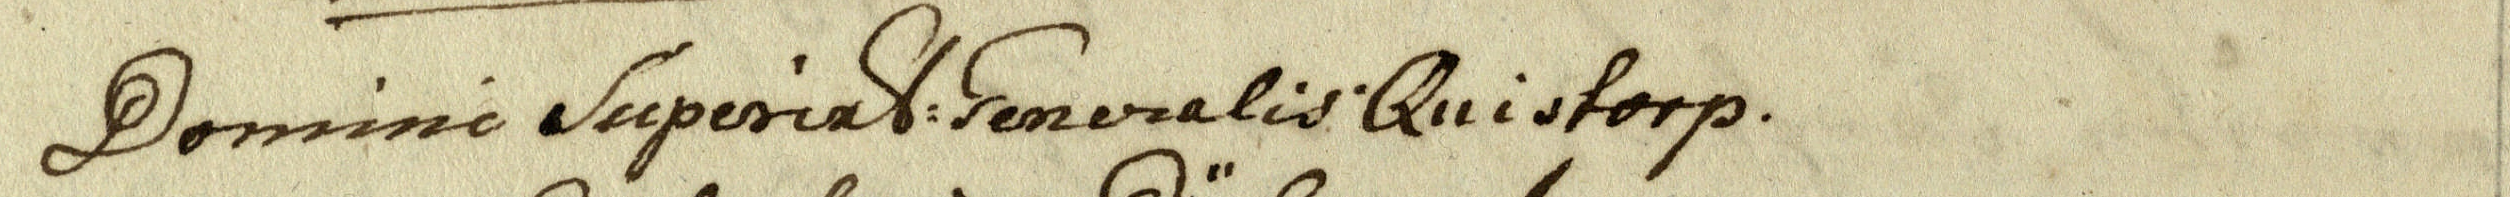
Domini Superint-Generalis Quistorp.
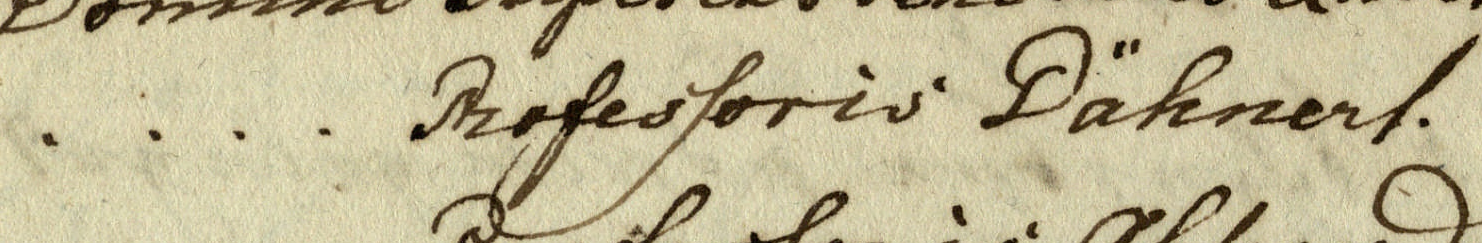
Professoris Dähnert.
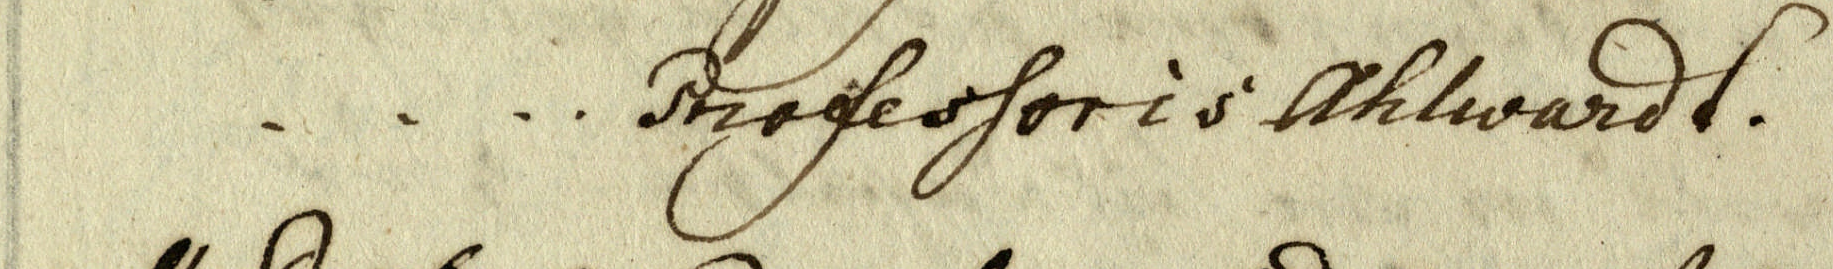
Professoris Ahlwardt.
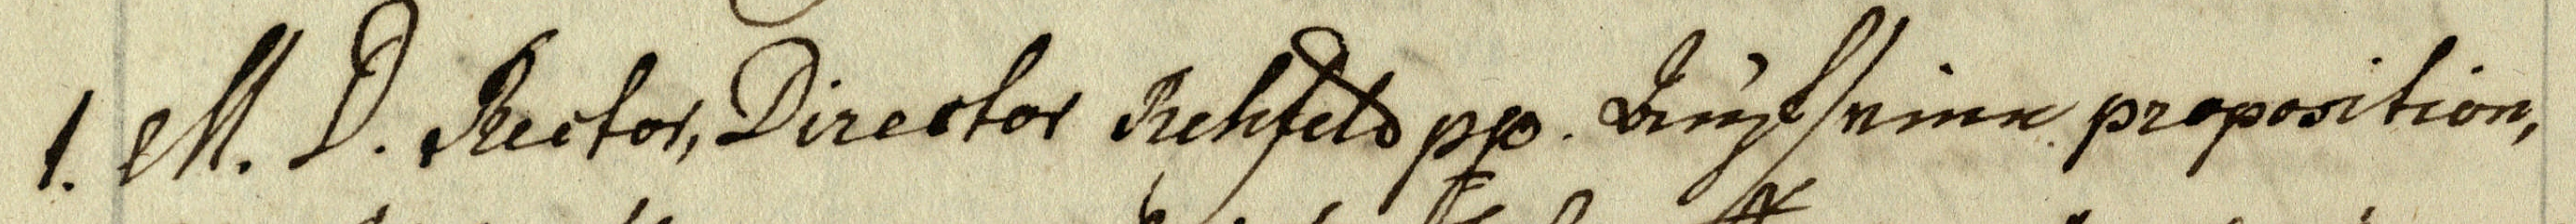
1. M. D. Rector, Director Rehfeld pp. Auf seine proposition,
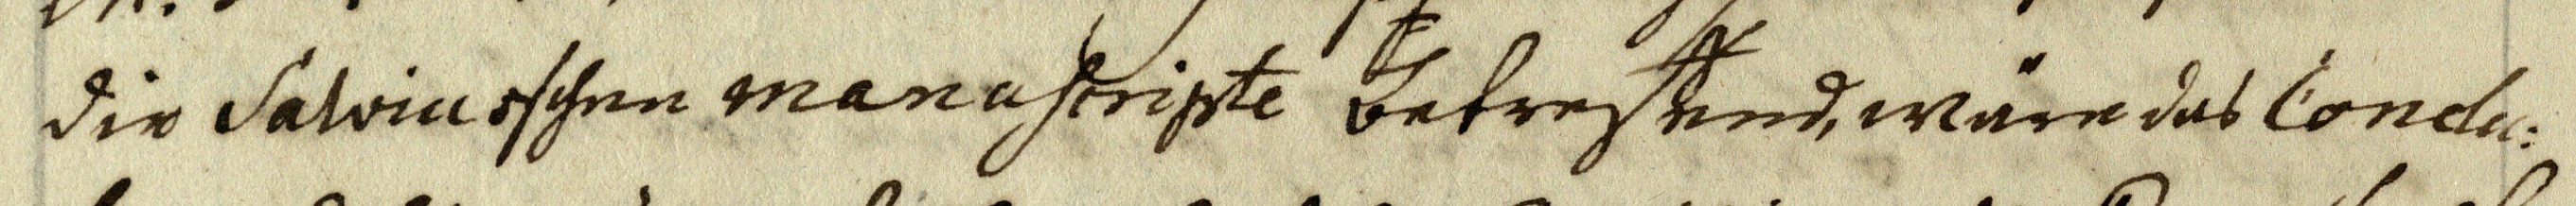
die Salviusschen manuscripte betreffend, wäre das Conclu¬
